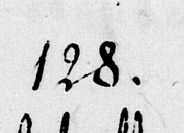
223.
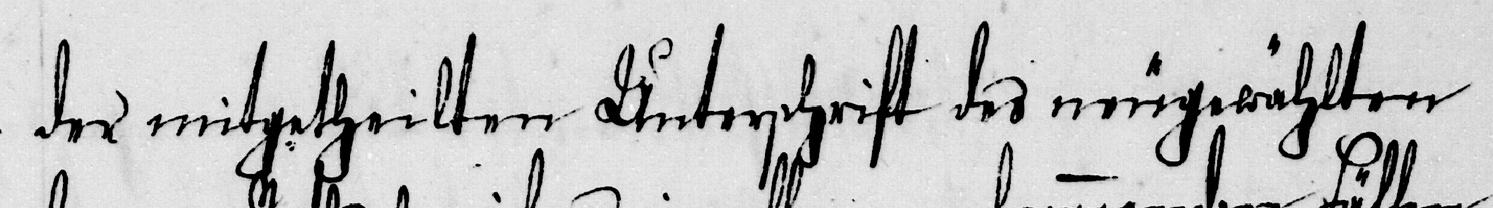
der mitgetheilten Unterschrift des neugewählten
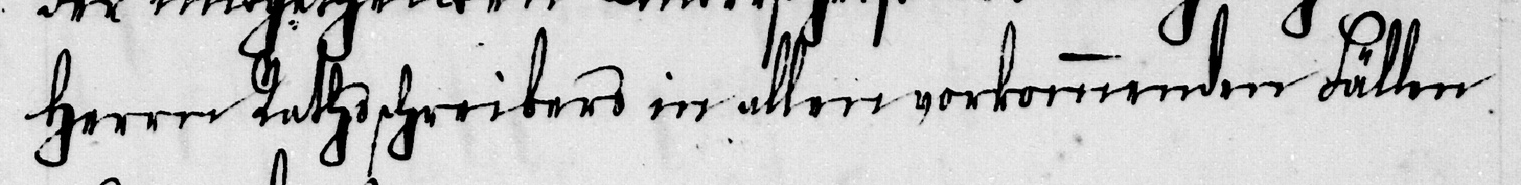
Herrn Rathsschreibers in allen vorkommenden Fällen
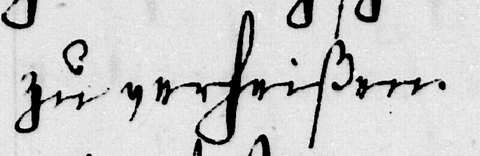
zu verheißen.
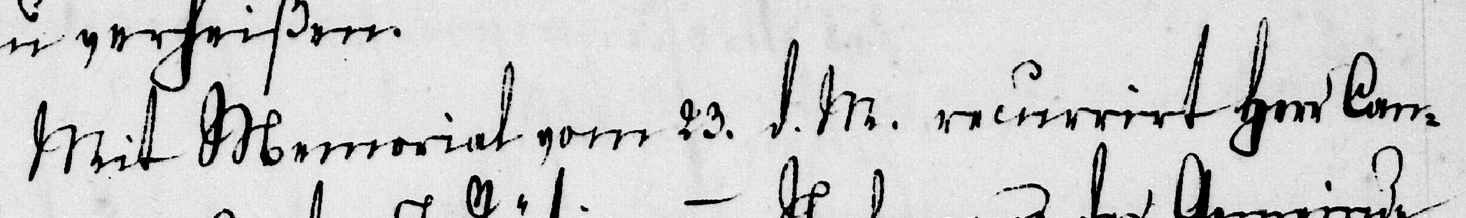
Mit Memorial vom 23. d. M. recurrirt Herr Can¬
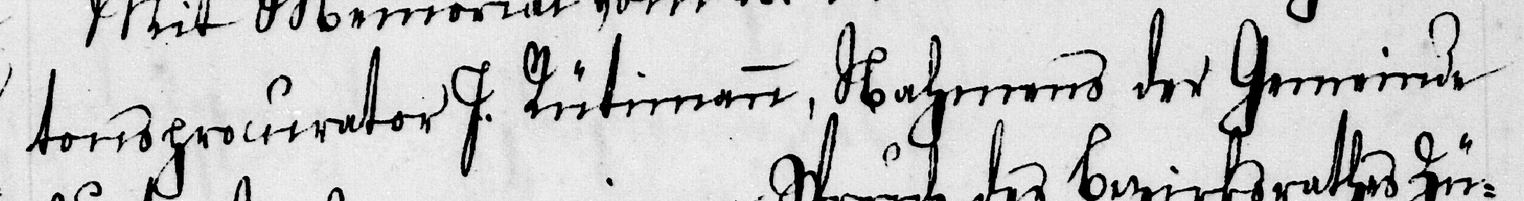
tonsprocurator J. Rütimann, Nahmens der Gemeinde
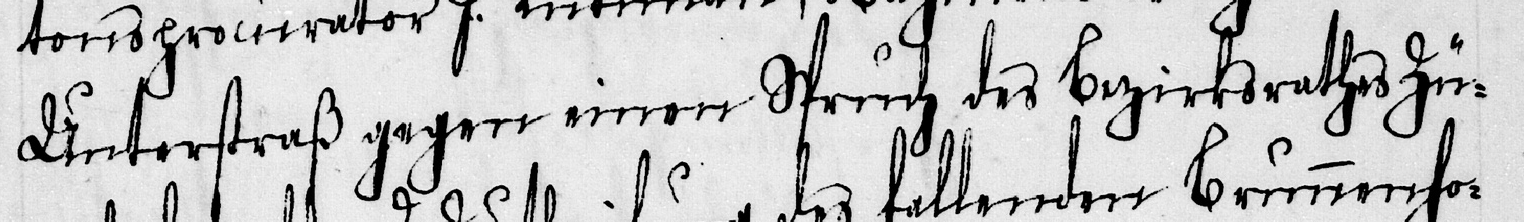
Unterstraß gegen einen Spruch des Bezirksrathes Zü¬
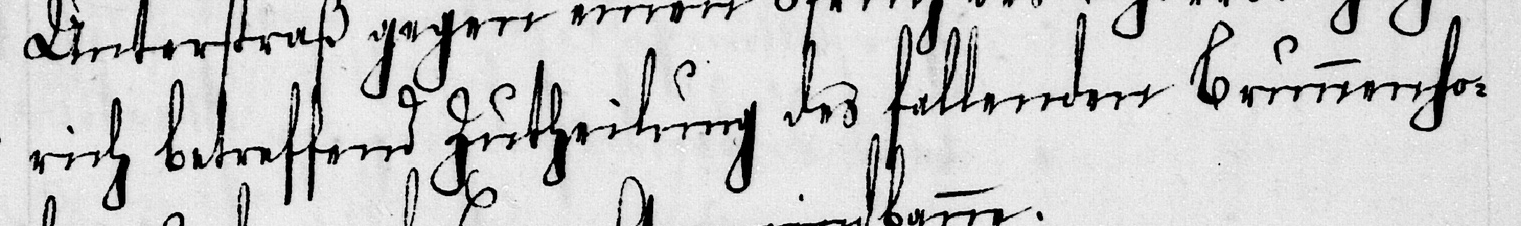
rich betreffend Zutheilung des fallenden Brunnenho¬
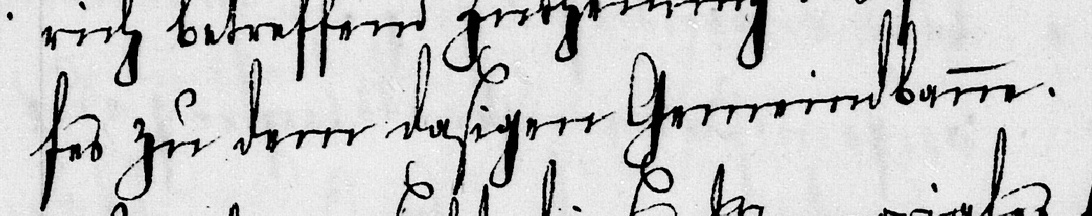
fes zu dem dasigen Gemeindbanne.
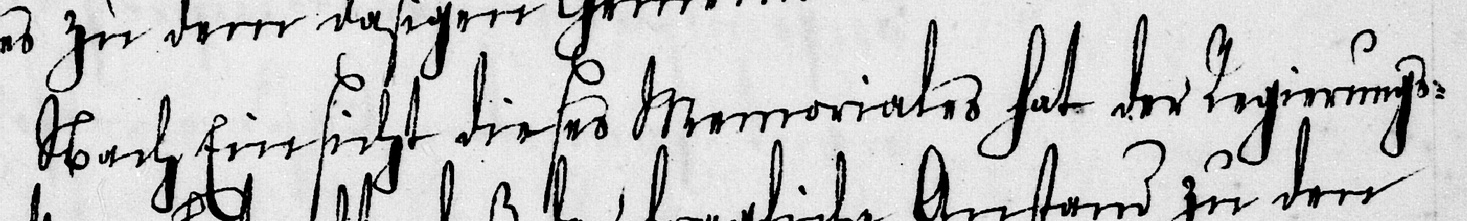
Nach Einsicht dieses Memorials hat der Regierungs¬
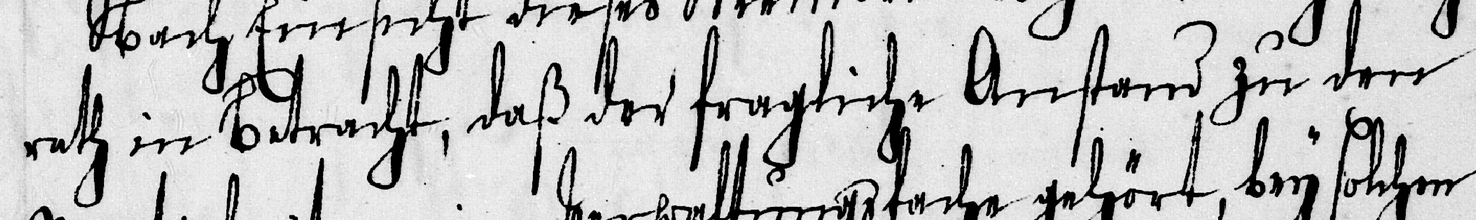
rath in Betracht, daß der fragliche Anstand zu den
